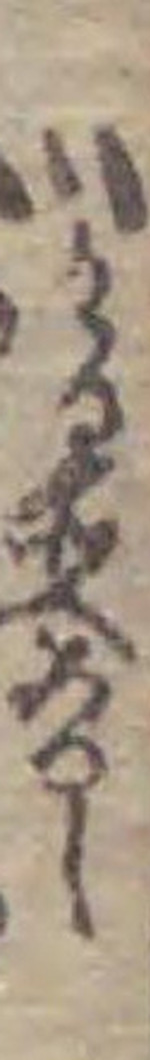かゝる所へあるし
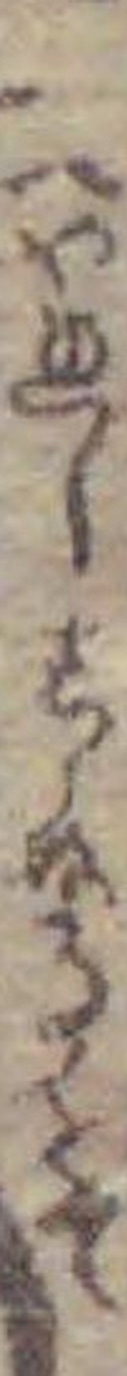やれ〳〵しらぬ事とて
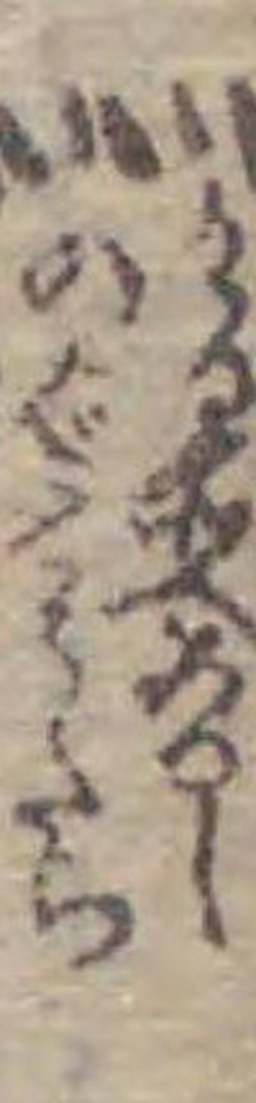のばとうたち
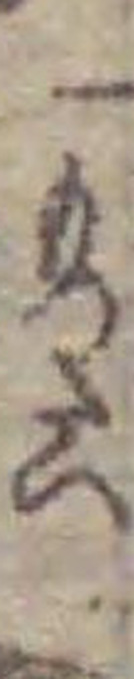もつたい
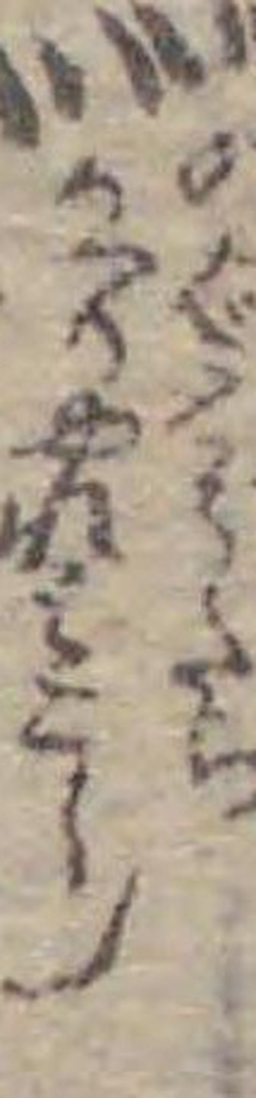かへりやれみこし
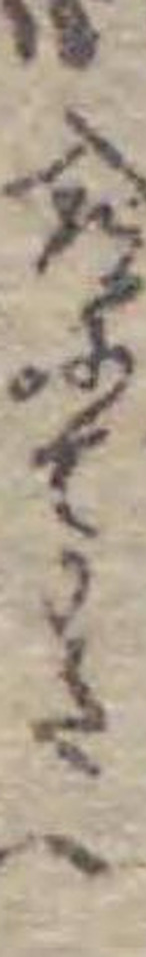入道にてわた
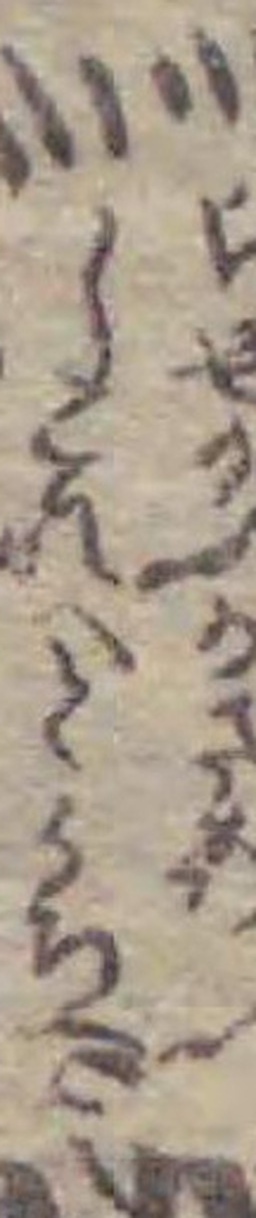〳〵これへとうちへ
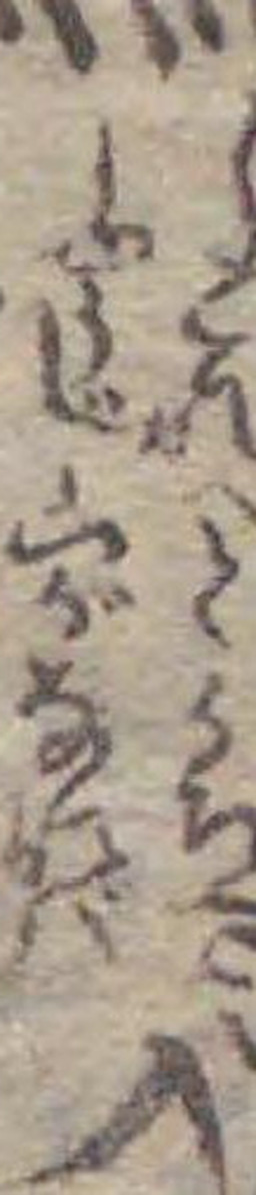しやうじ山がなれば
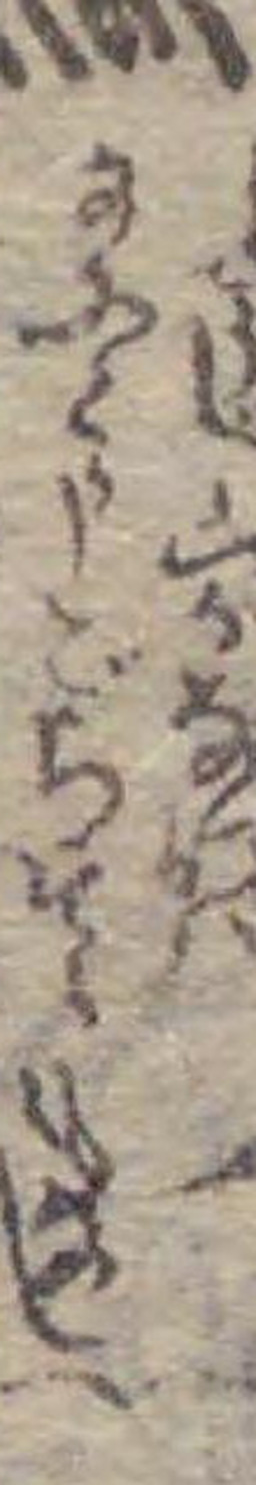なにと申ごちそうもなし
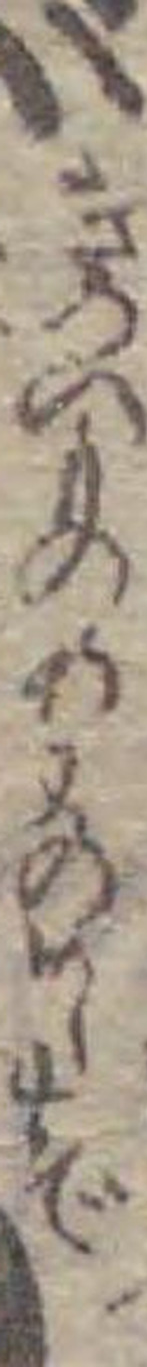きついものあわのめしまで
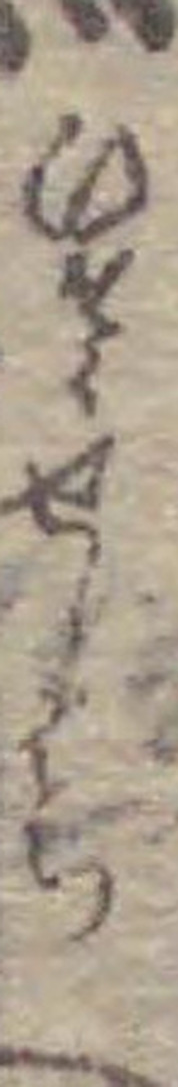ひそうせしはち
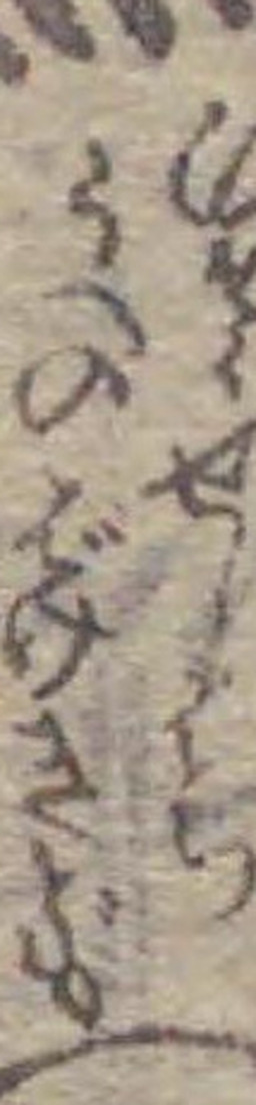うへのばけきども
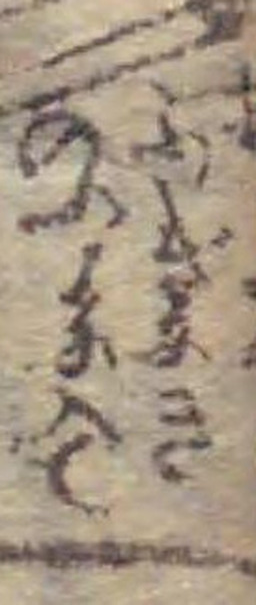のふに入て
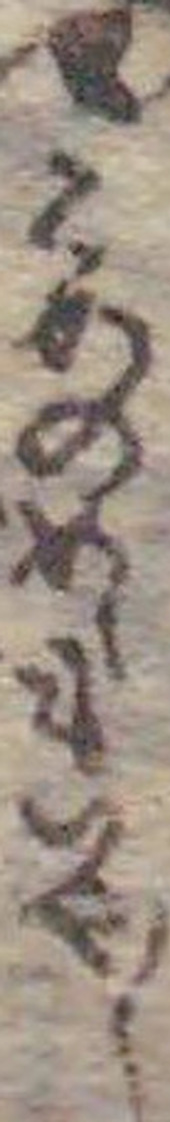こめのめしもいや〳〵
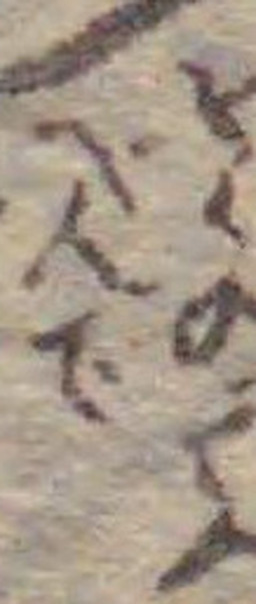へんで
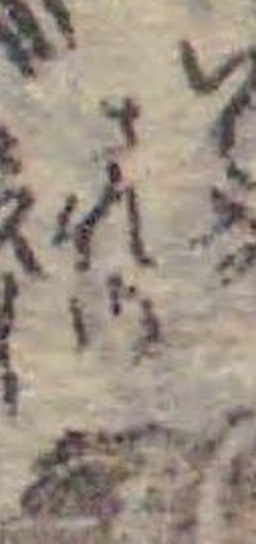され御
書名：[化物一代記] : 5巻
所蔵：国立国会図書館 National Diet Library, JAPAN
